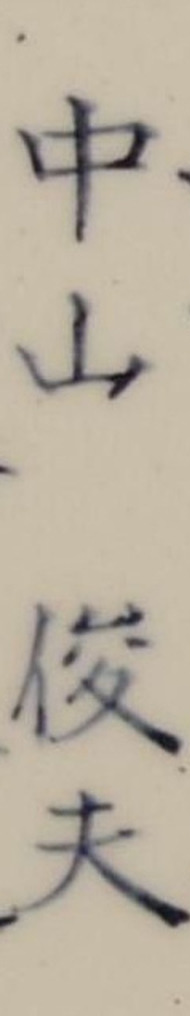中山俊夫
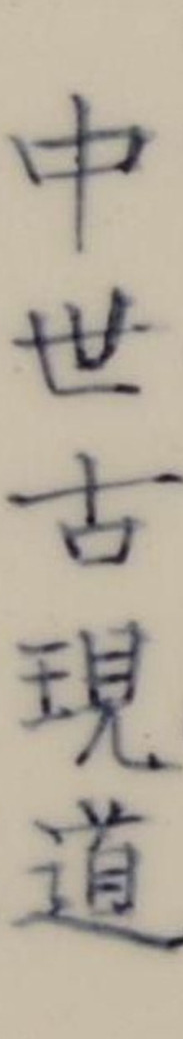中世古現道
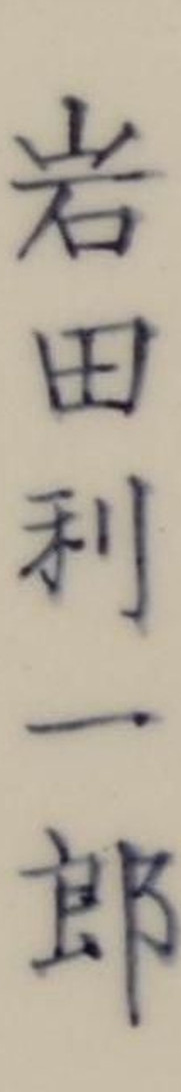岩田利一郎

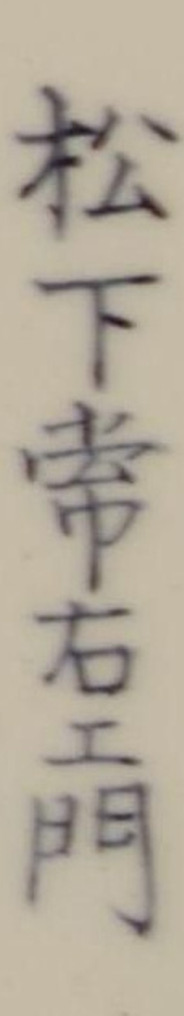松下常右エ門
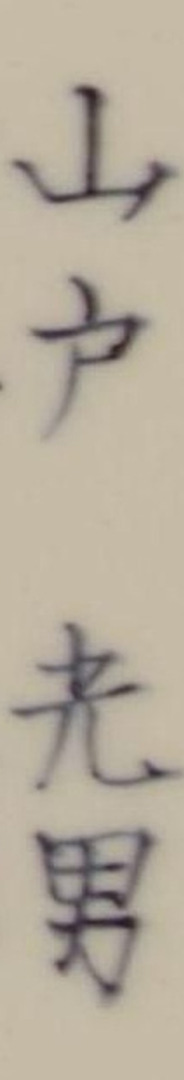山戸光男
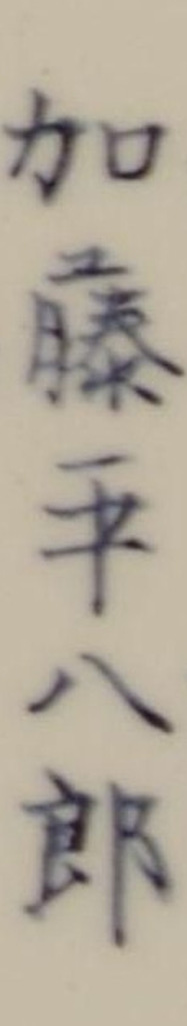加藤平八郎
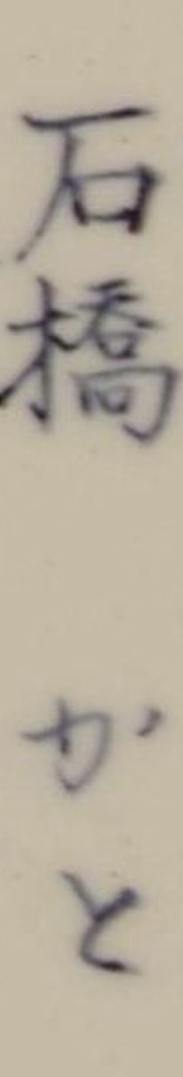石橋かと
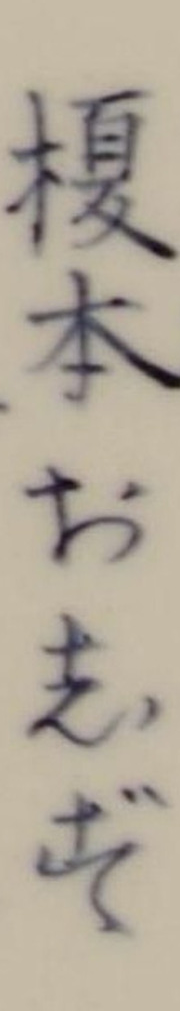榎本おしず
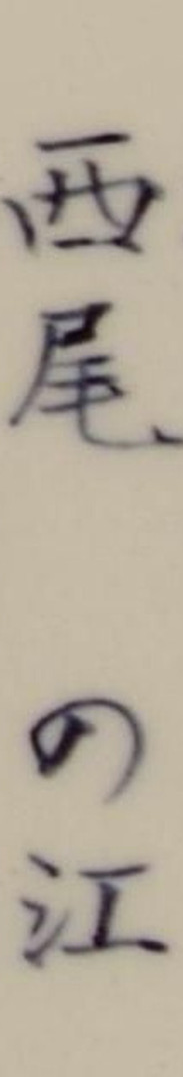西尾の江
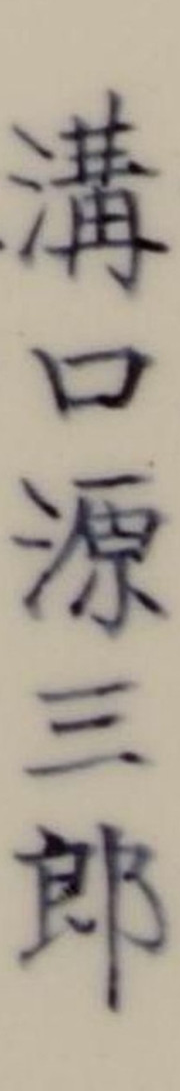溝口源三郎
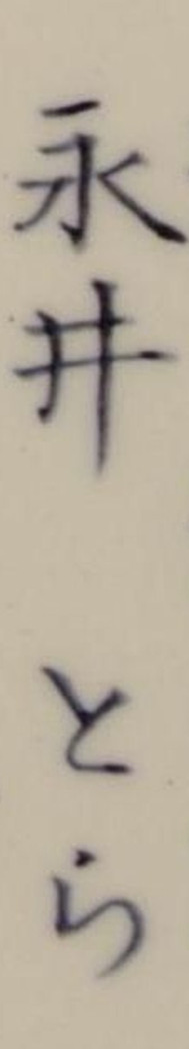永井とら
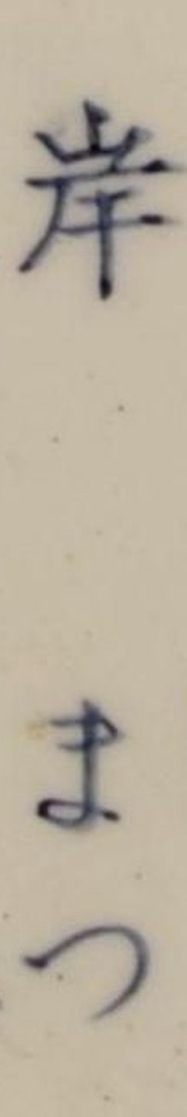岸まつ
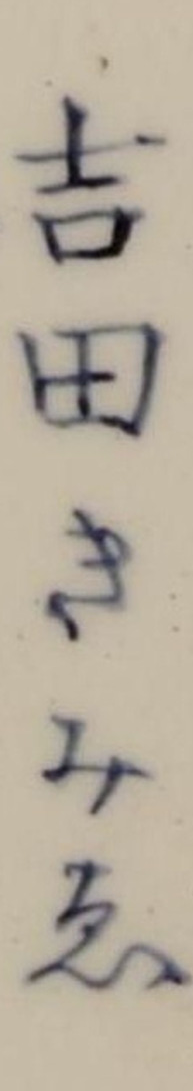吉田きみゑ
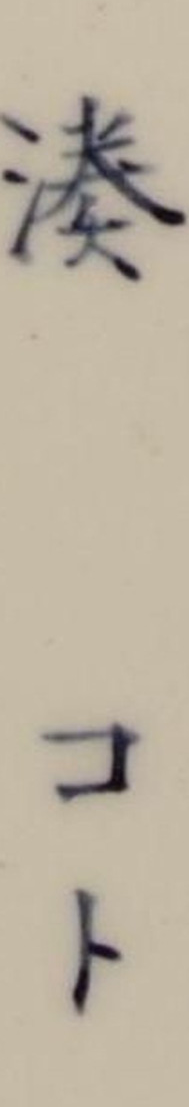湊コト
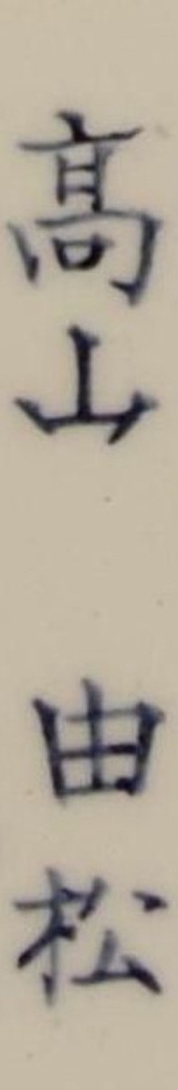高山由松
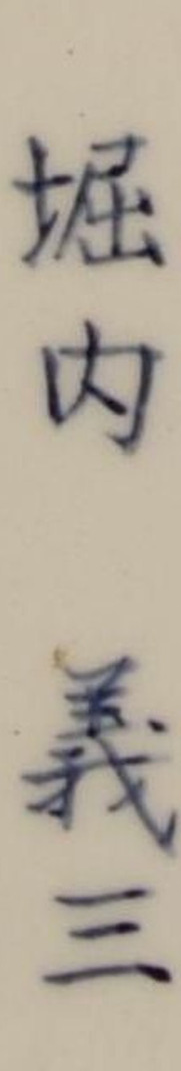堀内義三
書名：E~L
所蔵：高野山金剛峯寺
